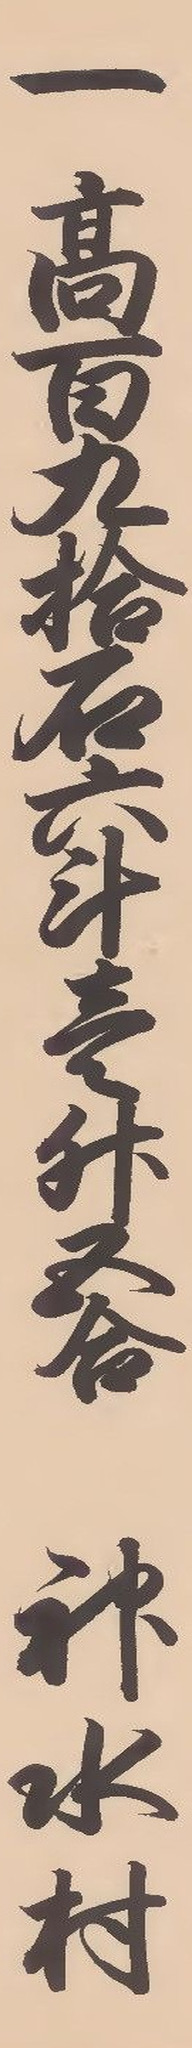一高百九拾石六斗壱升五合神水村
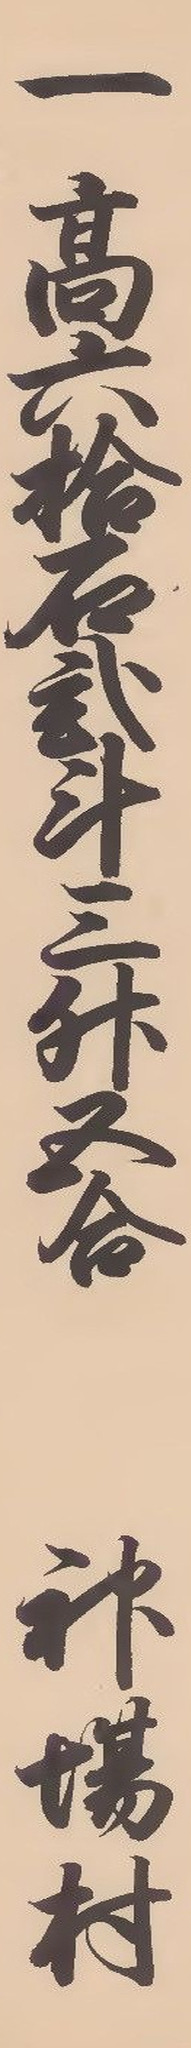一高六拾石弐斗三升五合神場村

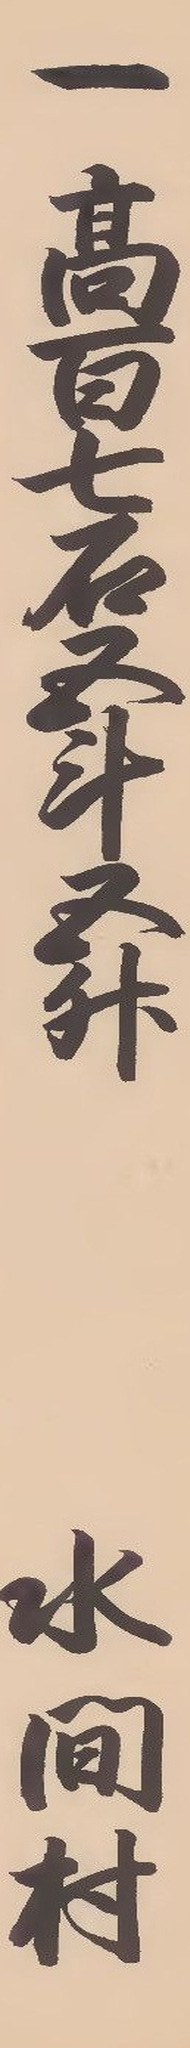一高百七石五斗五升水間村
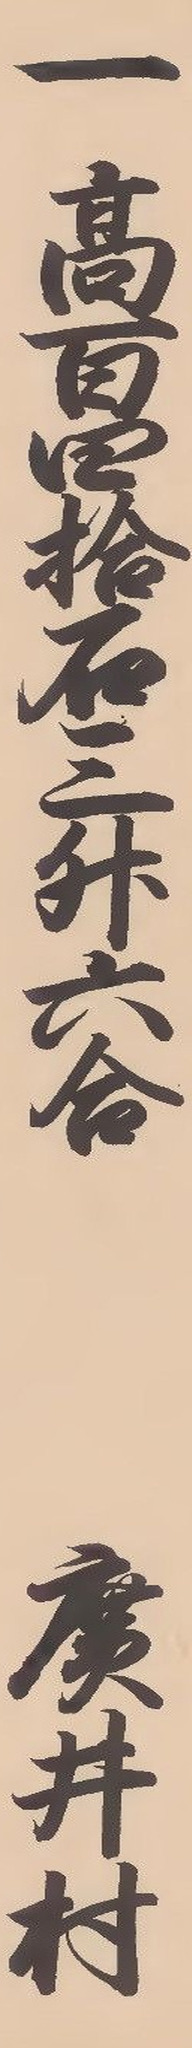一高百四拾石三升六合広井村
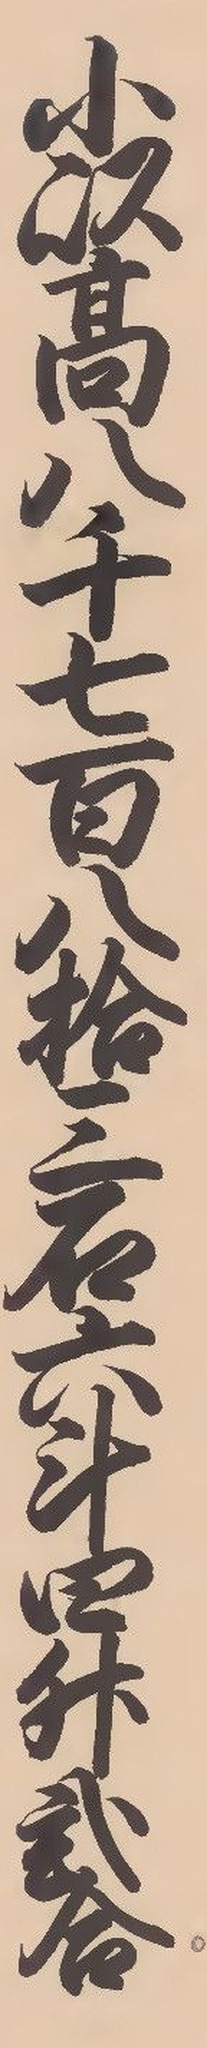小以高八千七百八拾三石六斗四升弐合
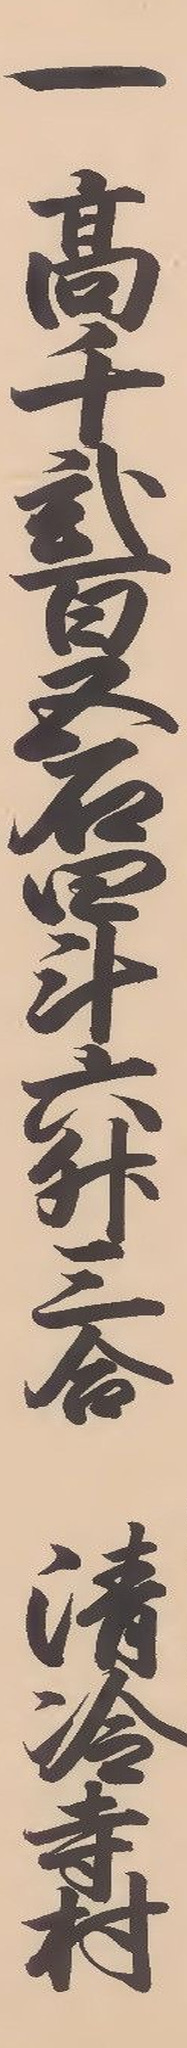一高千弐百五石四斗六升三合清冷寺村
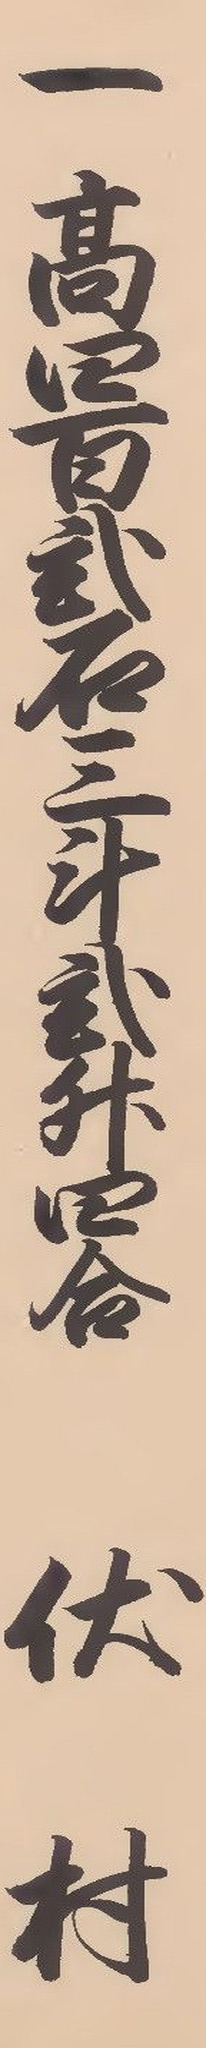一高四百弐石三斗弐升四合伏村
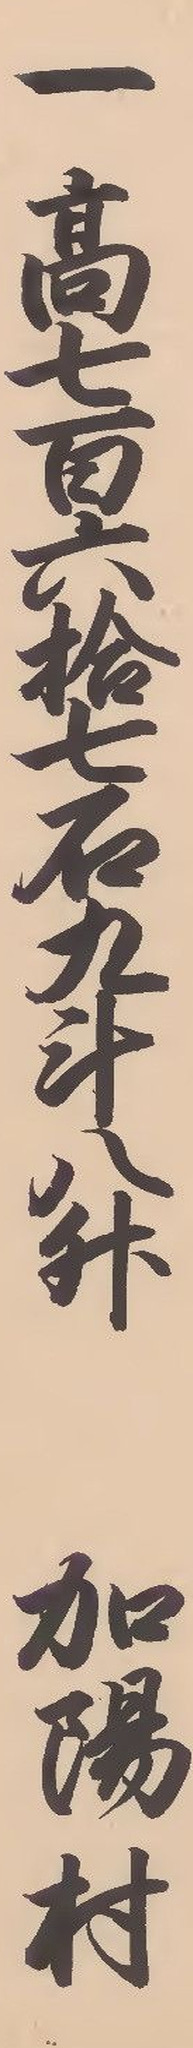一高七百六拾七石九斗八升加陽村

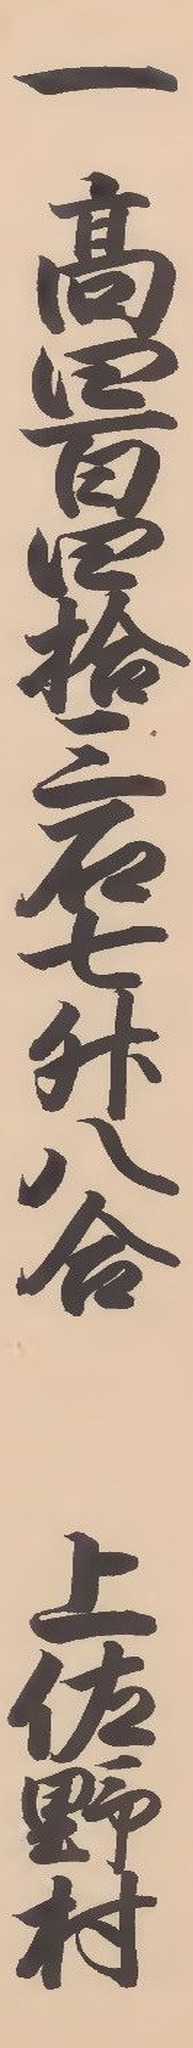一高四百四拾三石七升八合上佐野村
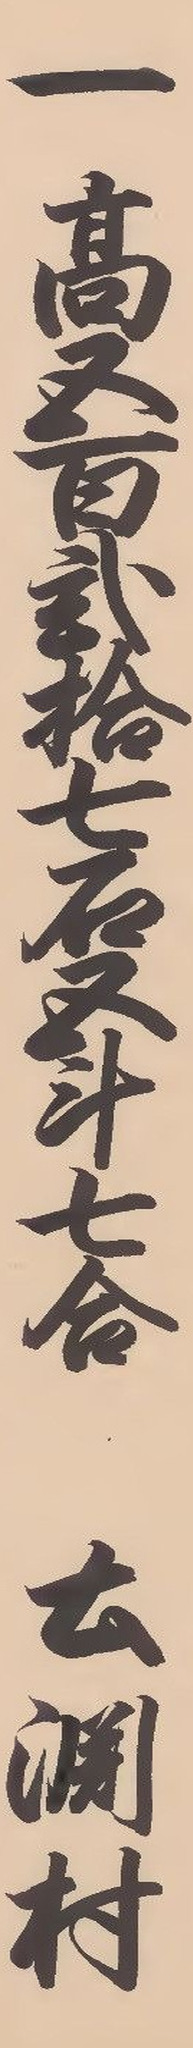一高五百弐拾七石五斗七合土淵村
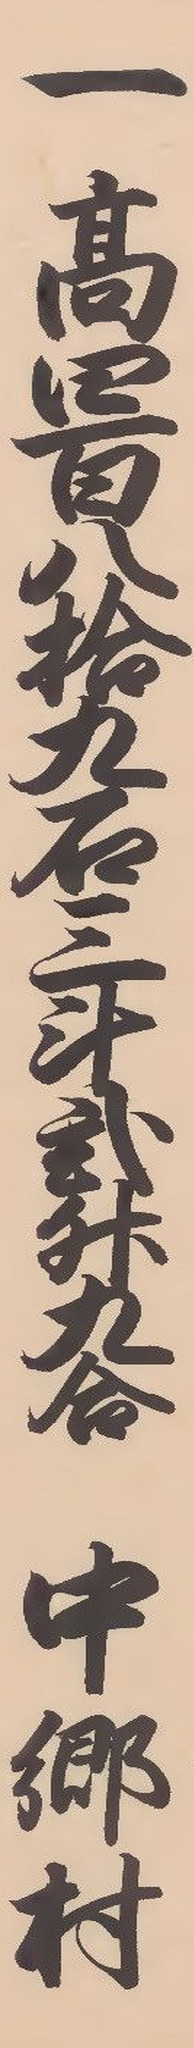一高四百八拾九石三斗弐升九合中郷村
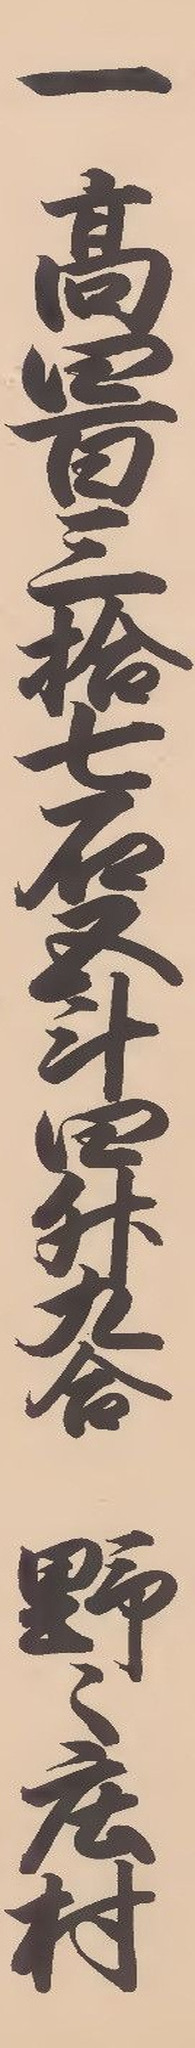一高四百三拾七石五斗四升九合野々庄村
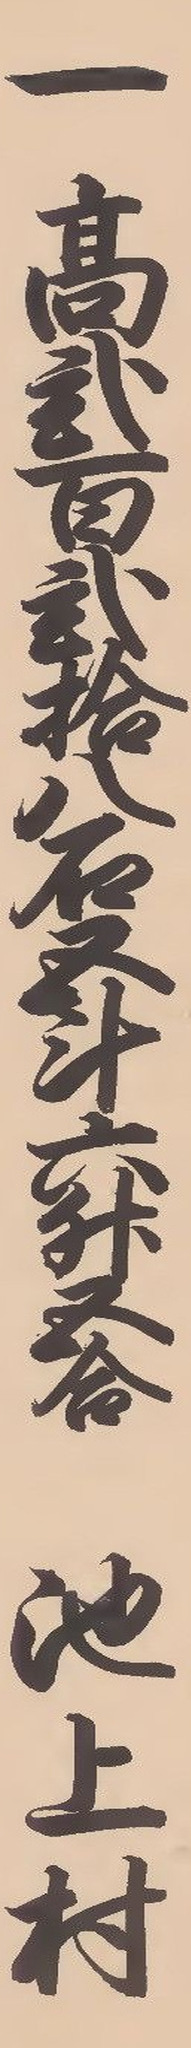一高弐百弐拾八石五斗六升五合池上村
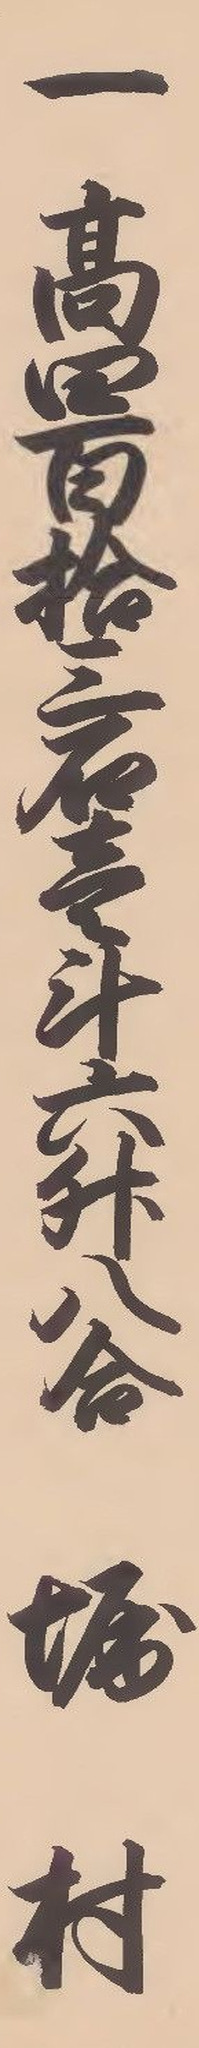一高四百拾三石壱斗六升八合堀村
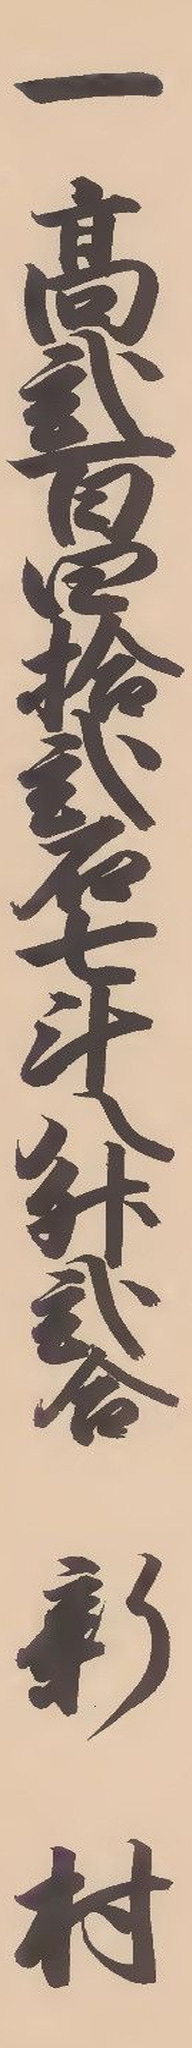一高弐百四拾弐石七斗八升弐合新村

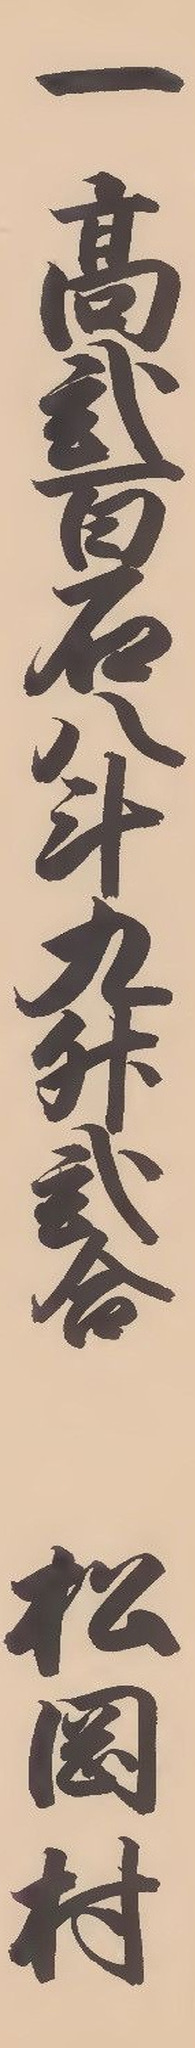一高弐百石八斗九升弐合松岡村
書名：但馬国郷帳
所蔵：国立公文書館 National Archives of Japan
